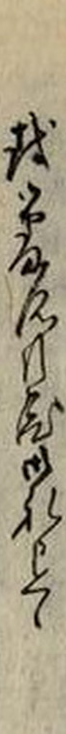越御番所引渡御礼申上候
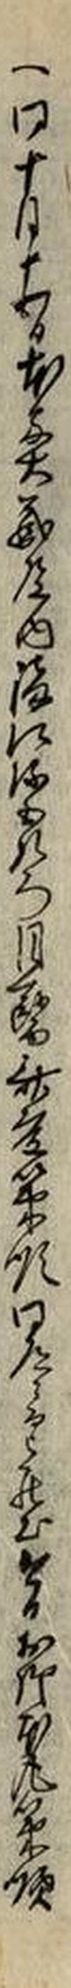一同十月十五日本多大蔵殿内海弥五八右衛門目医斉藤策順同道にて被罷出今日於御本丸策順
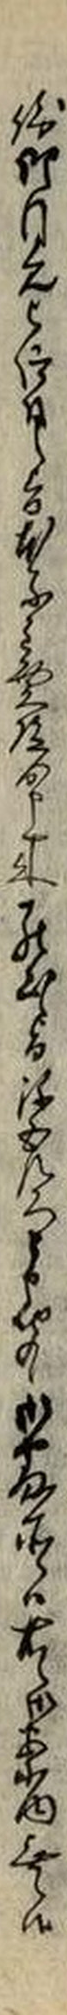則御目見被仰付候旨本多主殿殿ゟ申来罷出候旨弥五八右衛門被申聞候御番所には右之御案内無之候
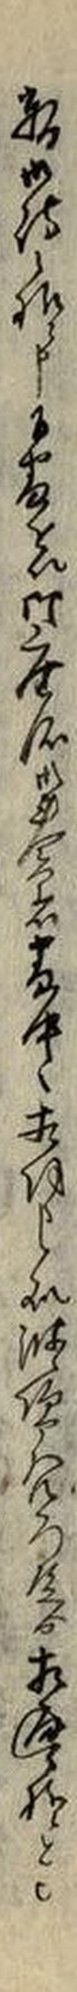暫御待候様被申下番を以御座所御奏者番中へ相伺申候処波々伯部八左衛門殿ゟ相通候様にと被
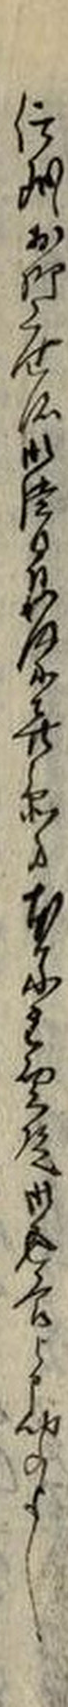仰越於御座所御徒目付岡本喜兵衛方本多主殿殿御返答被申聞候よし
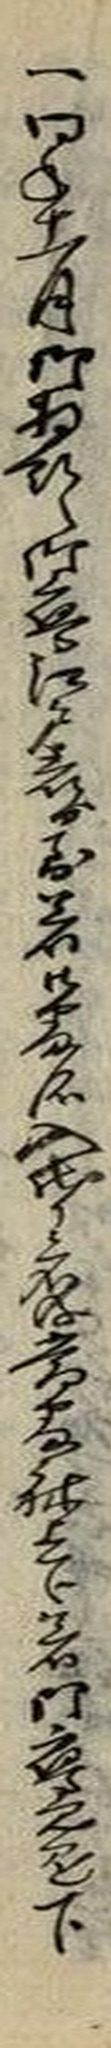一同年十一月御拝領之御鷹江戸表ゟ到着御番所入代り不致当番林吉郎着御鷹見懸下
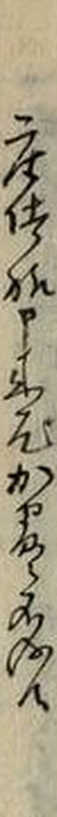座仕候様申来尤加番へ不渡候
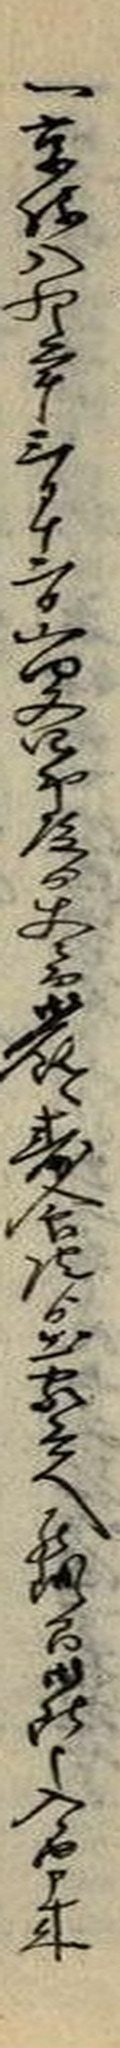一享保七卯年三月十二日山田又四郎殿ゟ使に而御厩へ寿合院ゟ出家壱人罷越候間御断申入候由申来
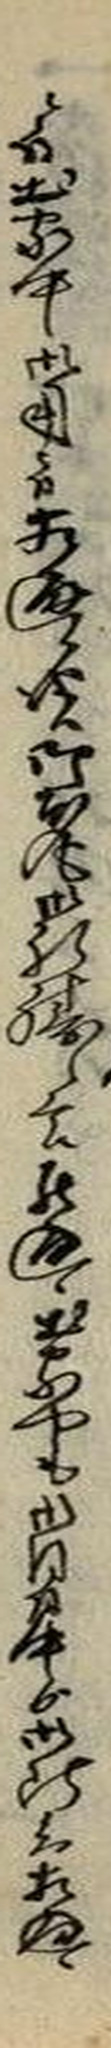候付出家中御用に付相通候儀は御本丸御祈祷之節罷通候出家中も御目付中ゟ御断に而相通候
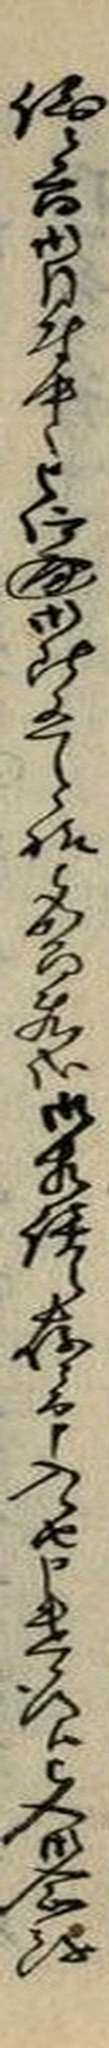儀に候間御目付中へ被仰通御断有之候様被成間敷哉御相談候故に而申入候由申遣候得は被入御念致
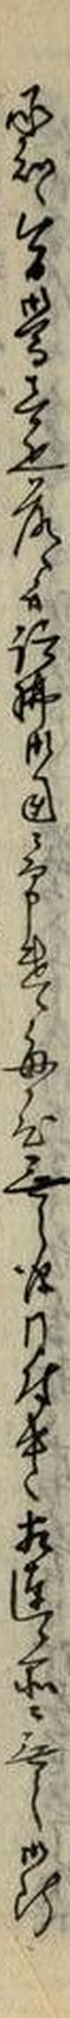承知候今日御馬壱疋落候に付跡払御用に而申遣候毎度無之儀目付中へ相達候所に無之御断
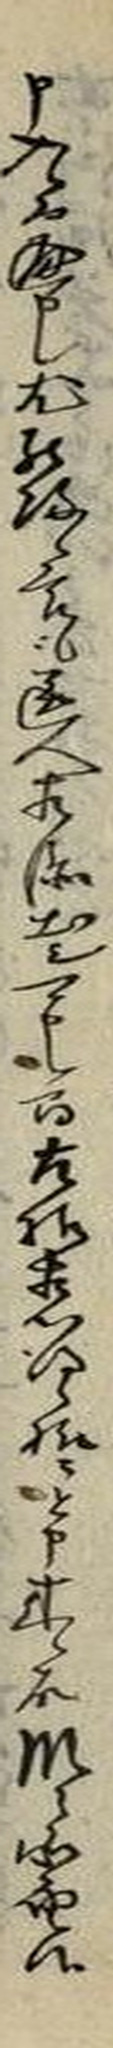申入候而通申候尤断帰候節も送人相添出し可申候間左様相心得候様にと申来候段承届候
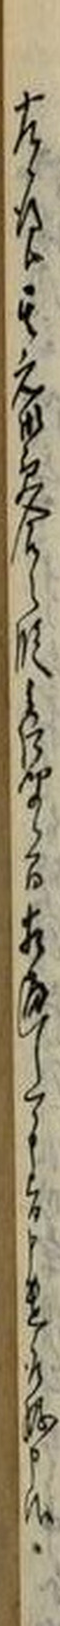左候得は其元御受合候段被仰聞候間相通し可申旨申遣取扱申候
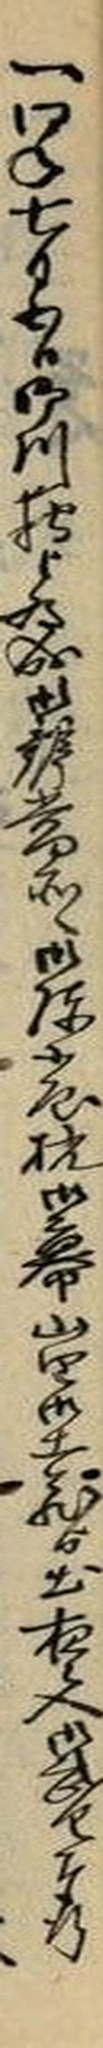一同年七月五日御川狩被為成御弁当所へ御陣小屋枕御幕山里御土蔵ゟ出夜に入御武具奉行
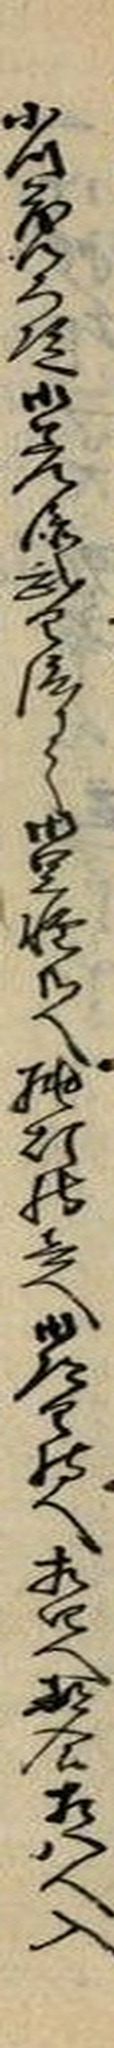小川茂右衛門殿御差添武具渡之御足軽弐人提灯持壱人御道具持人拾四人都合拾八人入
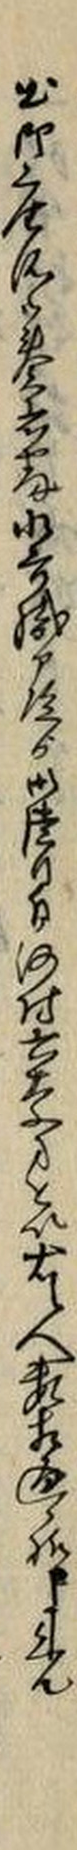出御座所御奏者番水谷織部殿ゟ御徒目付河村六太夫方を以右之人数相通候様申来候
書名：御門御櫓之部
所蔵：福井県文書館 Fukui Prefectural Archives
